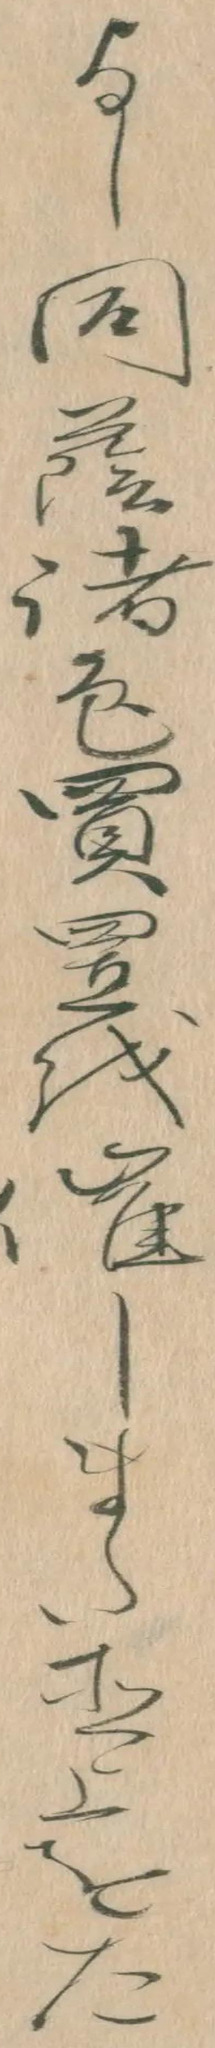よし同薩諸色買置を催しまた直上をた
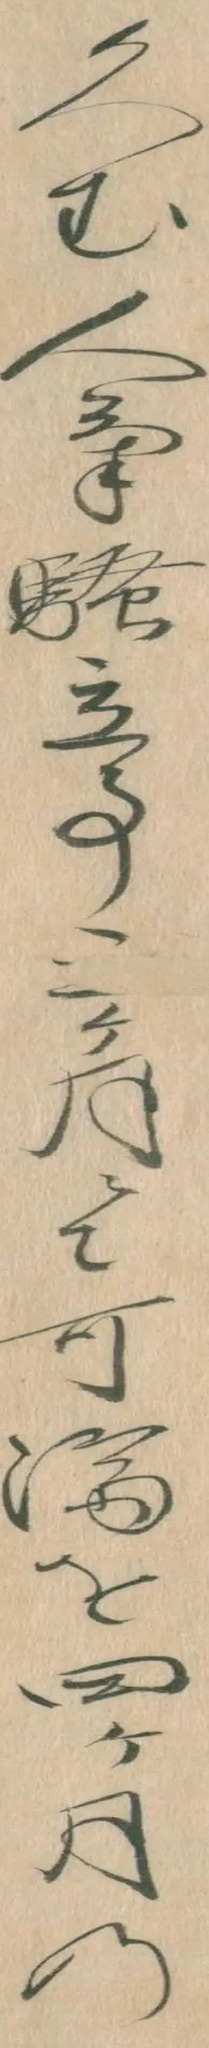くむ人騒立事三ヶ月とて可満を四ヶ月の
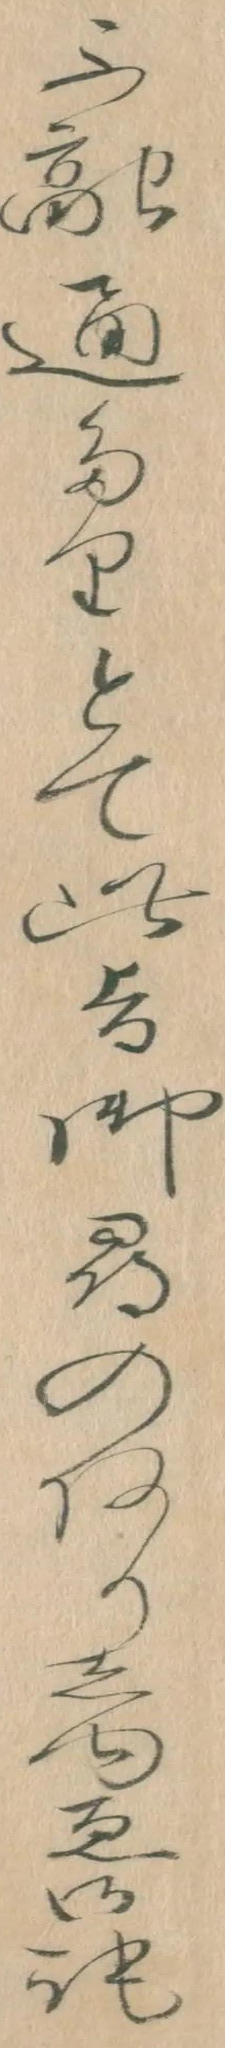ふ離通たりとて此旨御尋のありしゆゑ御記

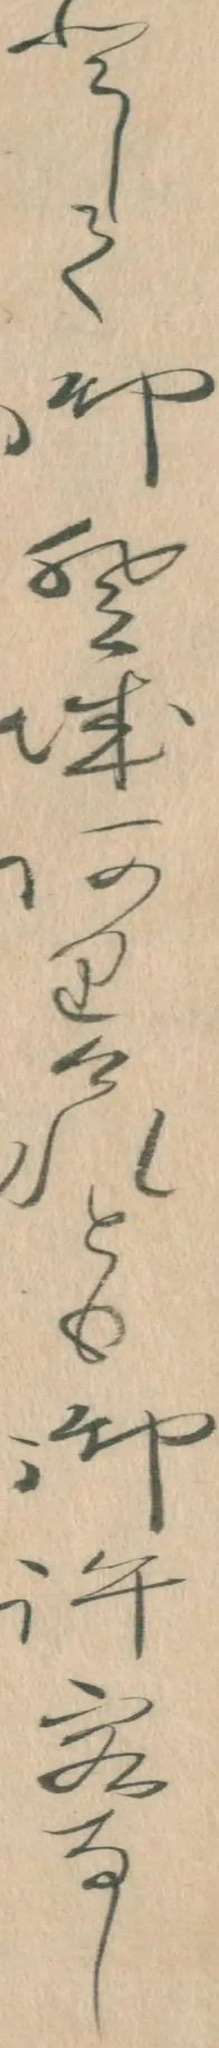として御登城ありけれとも御許容なし
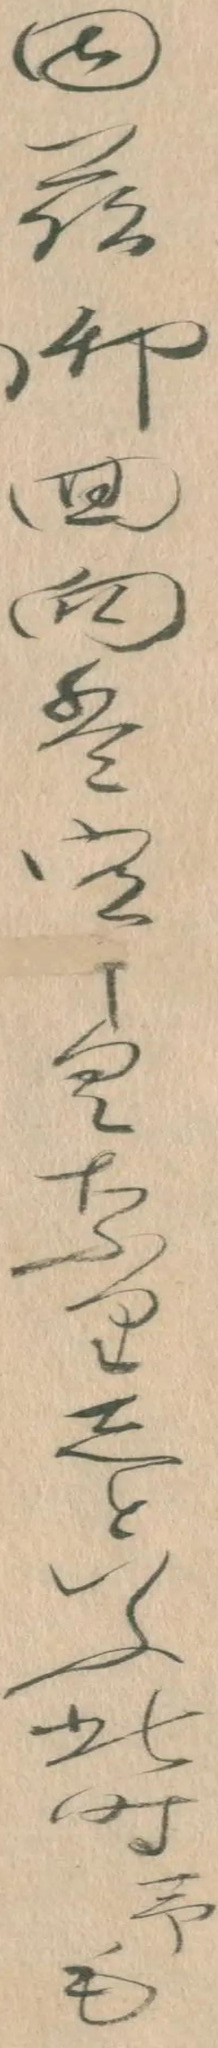因兹御回向は空しくなりしといふ此時予も
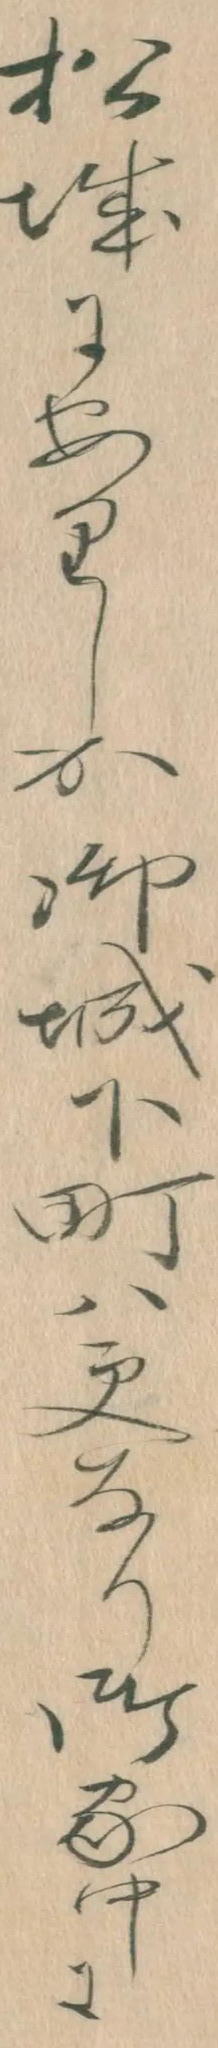松城にありしか御城下町は更なり御家中に
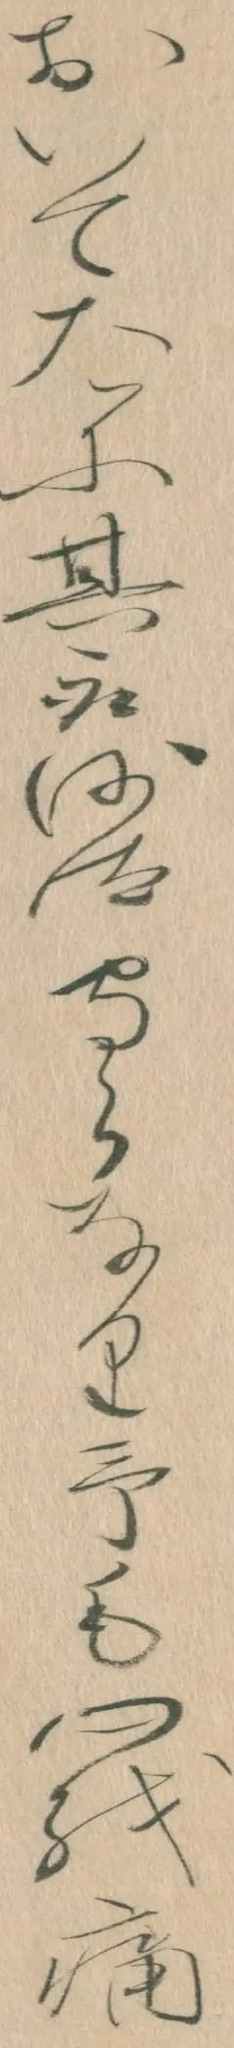おいてたふ其取沙汰専らなり予も心を痛
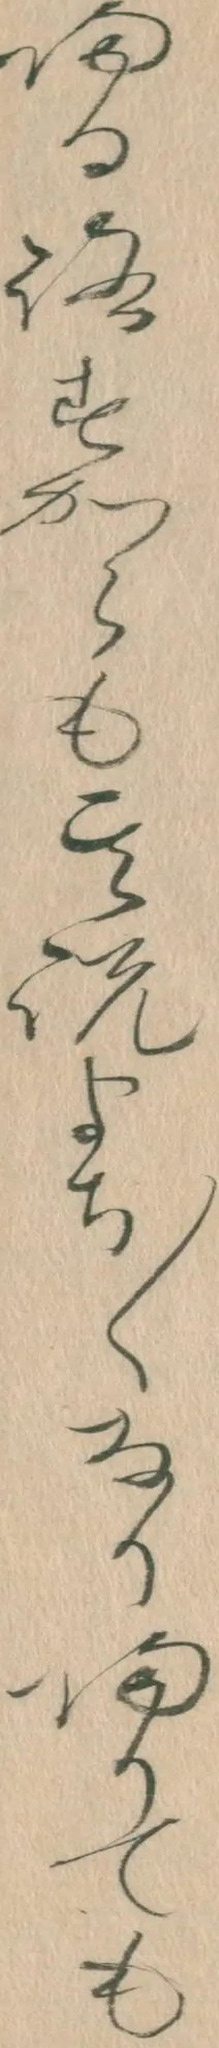帰る路すからも其説よち〳〵なり帰りても
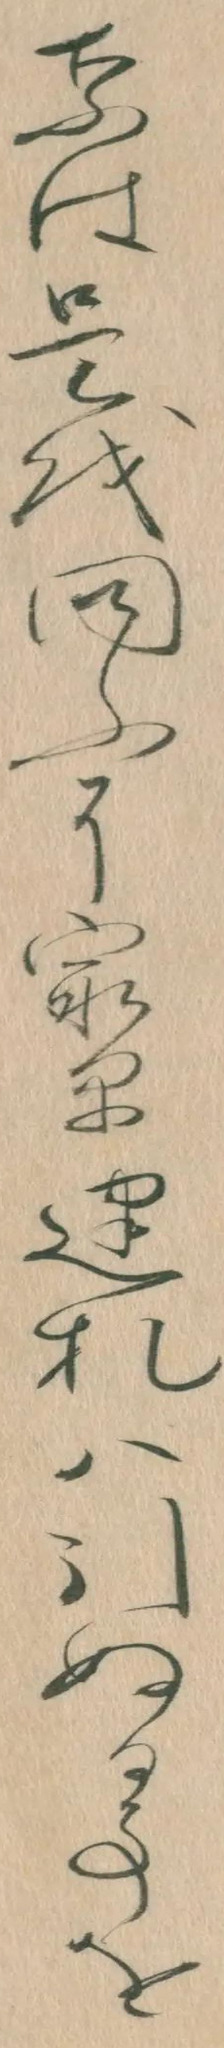なは是を同ふに最早建札は引ぬる事を
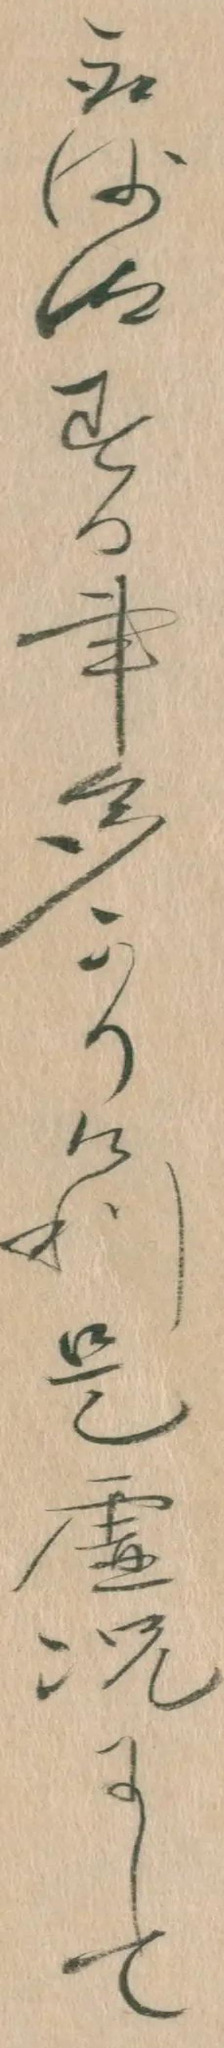取沙汰する事多かりけり其虚説にして
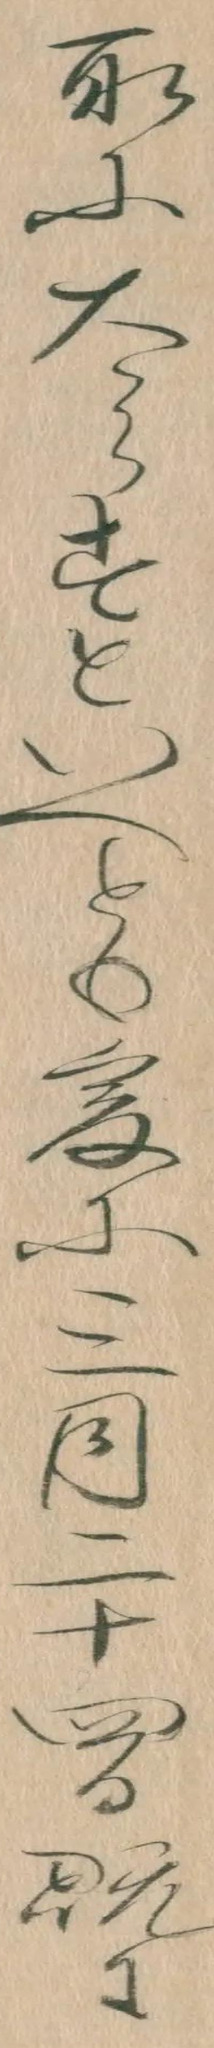所にたらすといへとも爰に三月二十四日既に
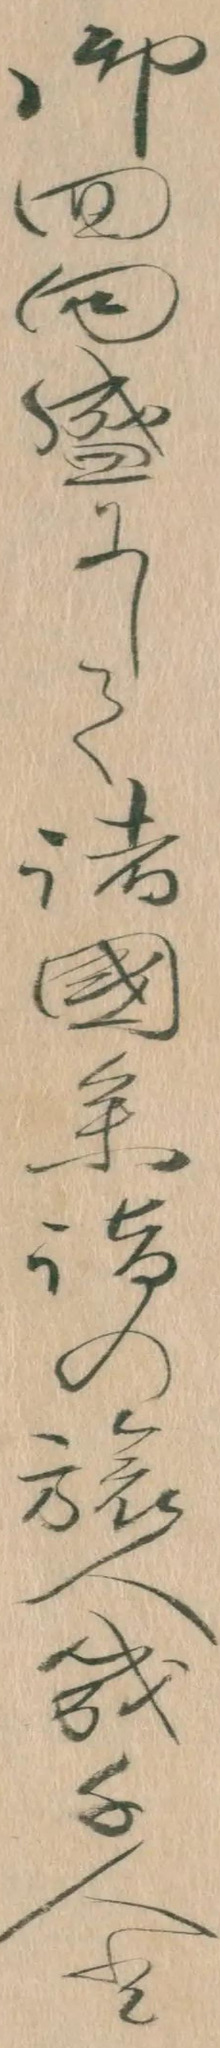御回向盛にして諸国参詣の旅人幾千人と
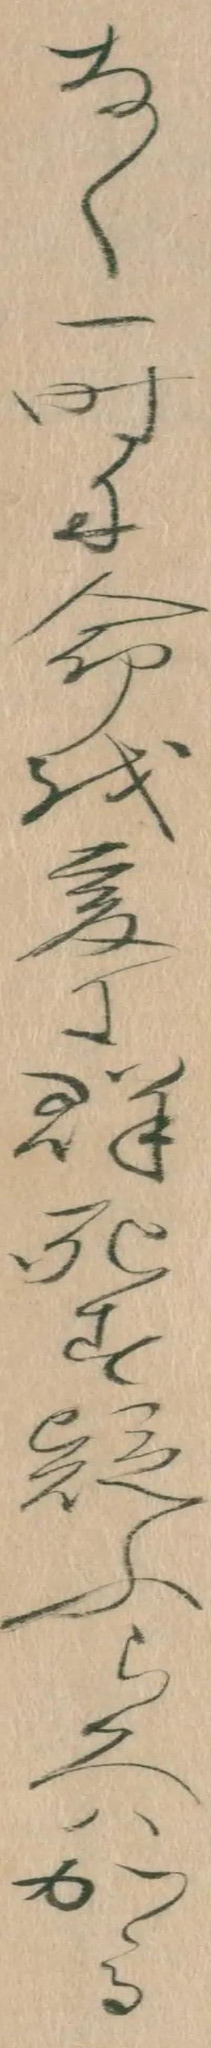なく一時に命を爰に群死は疑ふらくはかゝる
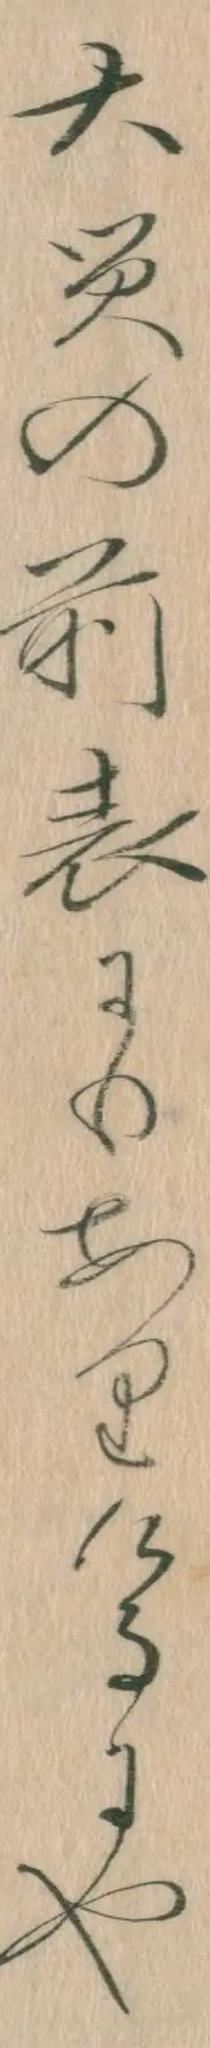大災の前表にもありけるにや
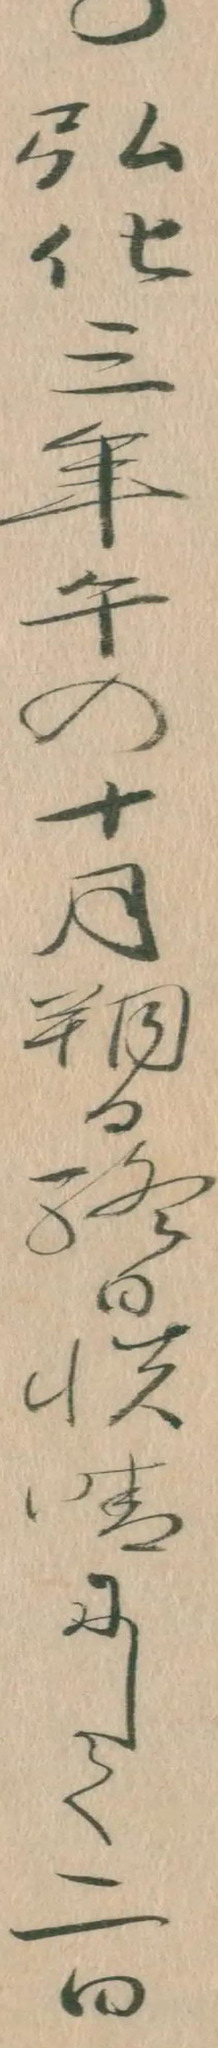○弘化三年午の十月朔日終日悦晴にして二日
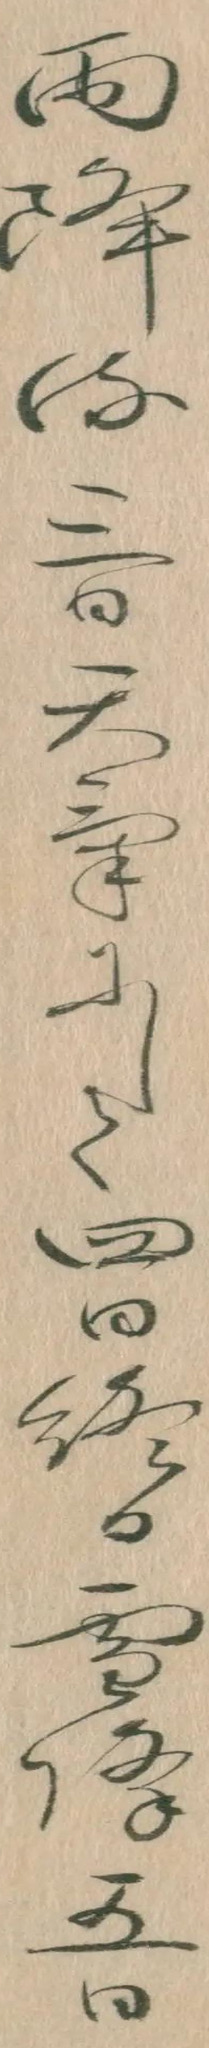雨降る三日天気にして四日終日雪降五日
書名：俗語之種. [1]
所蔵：国立国会図書館 National Diet Library, JAPAN
